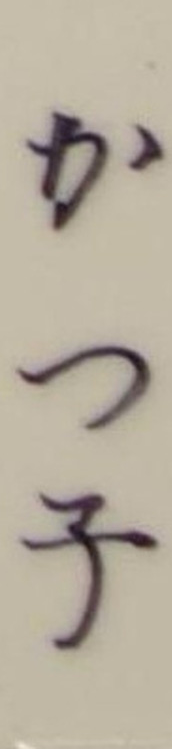かつ子
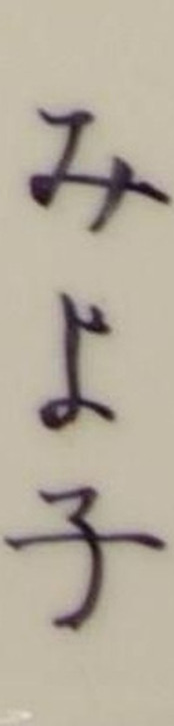みよ子
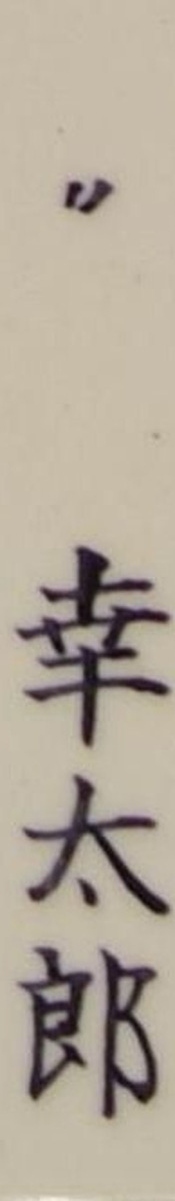幸太郎
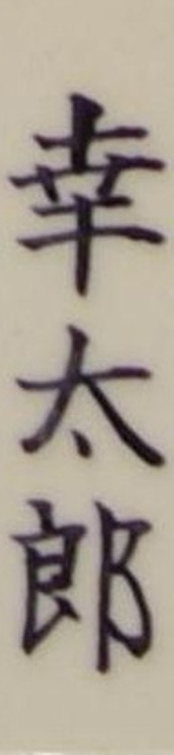幸太郎
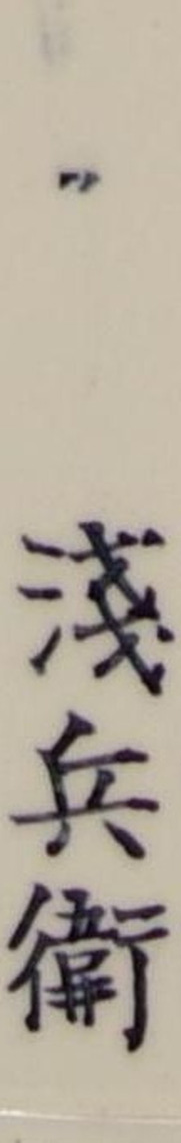浅兵衛
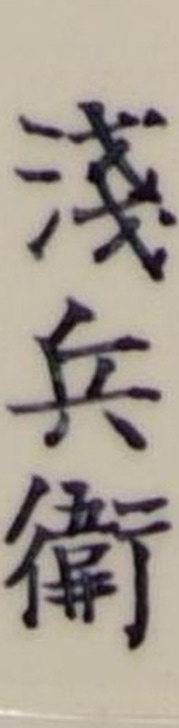浅兵衛
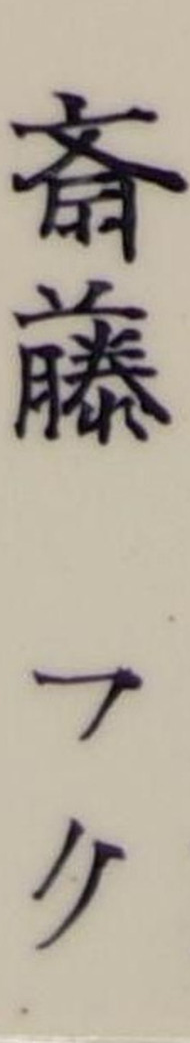斎藤トク
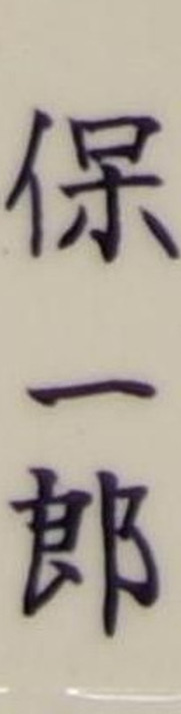保一郎
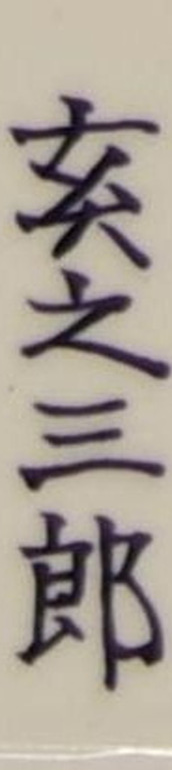亥之三郎
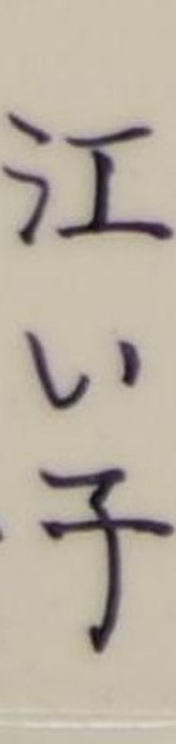江い子

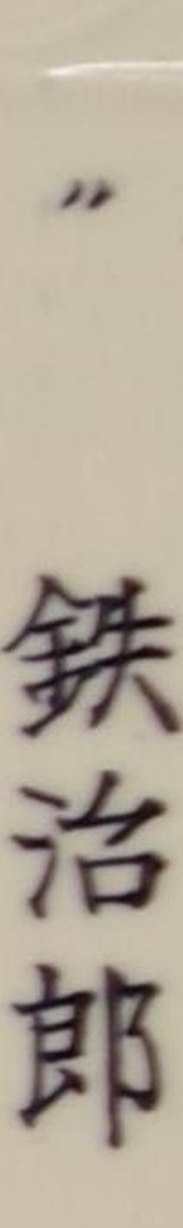鉄治郎
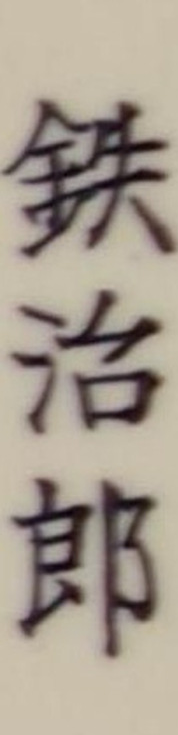鉄治郎
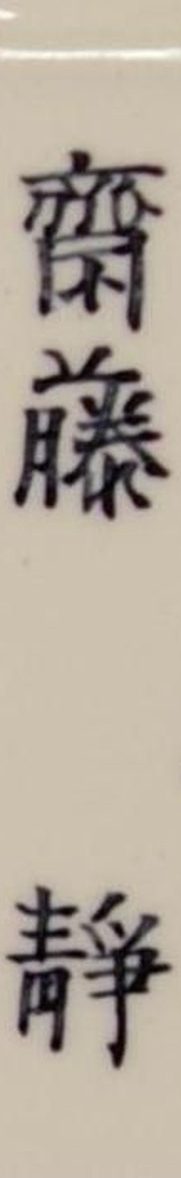斎藤静
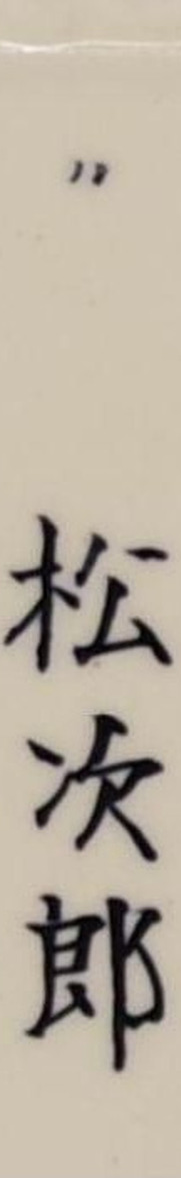松次郎
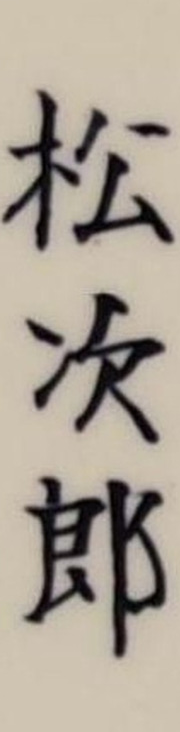松次郎
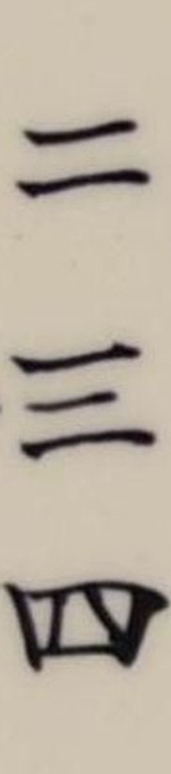二三四
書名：E~L
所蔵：高野山金剛峯寺
